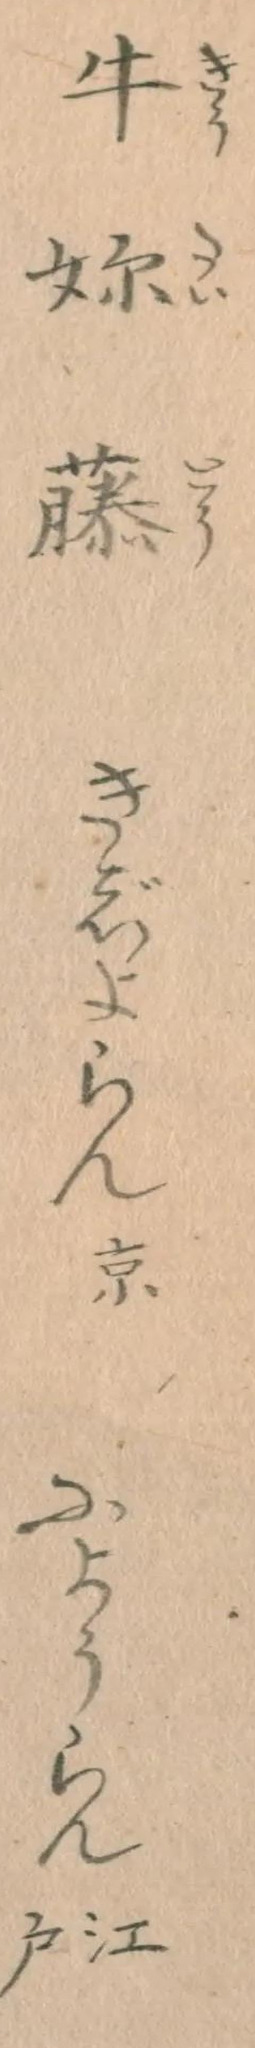牛嬭藤きじよらん京ふようらん江戸
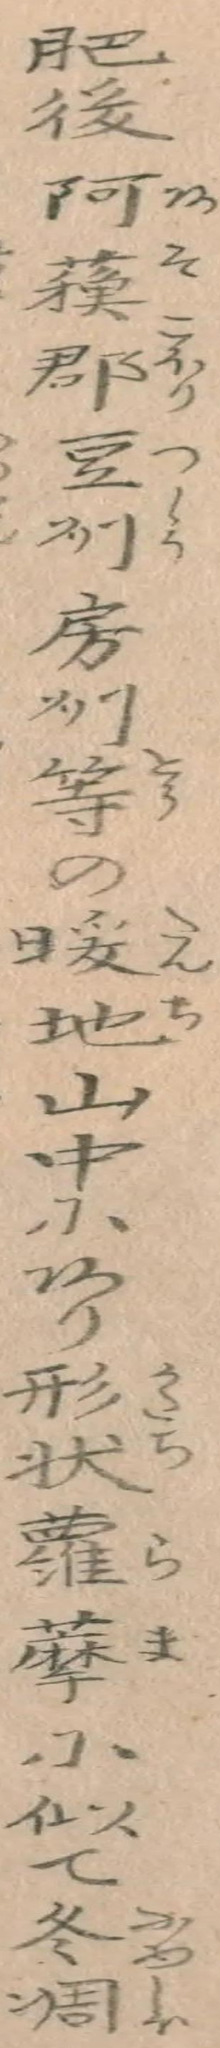肥後阿蘇郡豆州房州等の暖地山中にあり形状蘿藦に似て冬凋
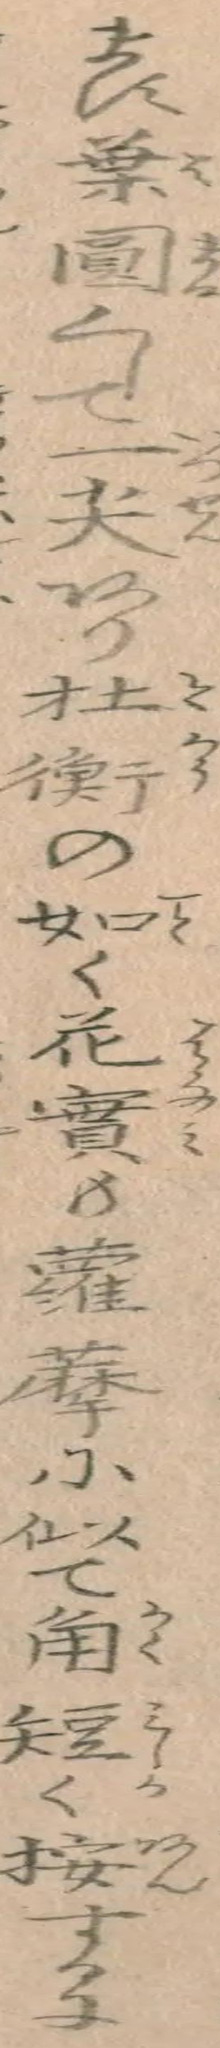ます葉円くして一尖あり杜衡の如く花実も蘿藦に似て角短く按するに
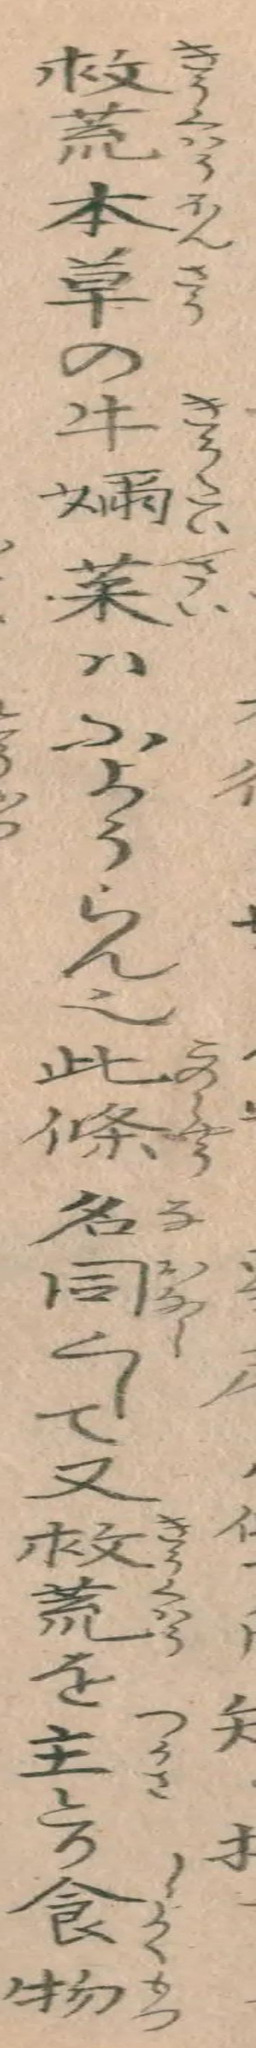救荒本草の牛嬭菜はふようらん也此条名同くして又救荒を主とり食物
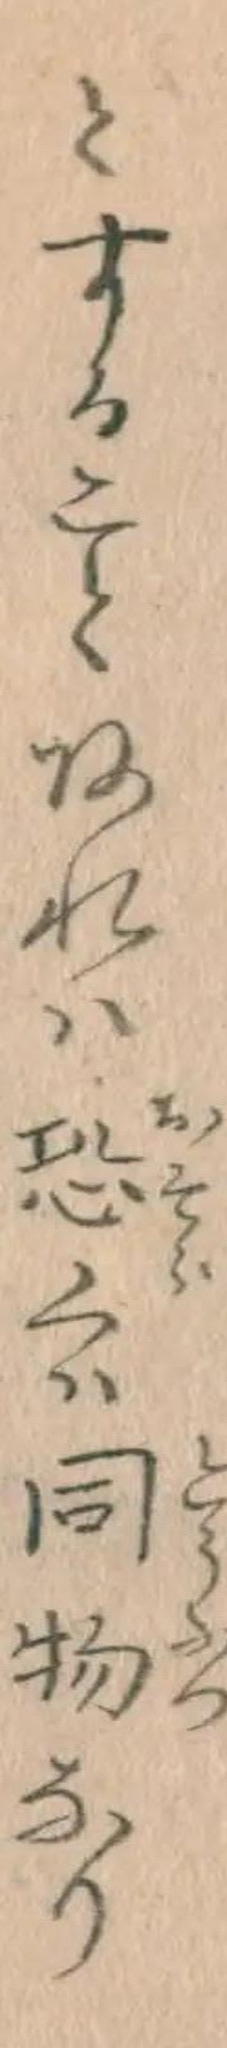とすることあれは恐くは同物なり
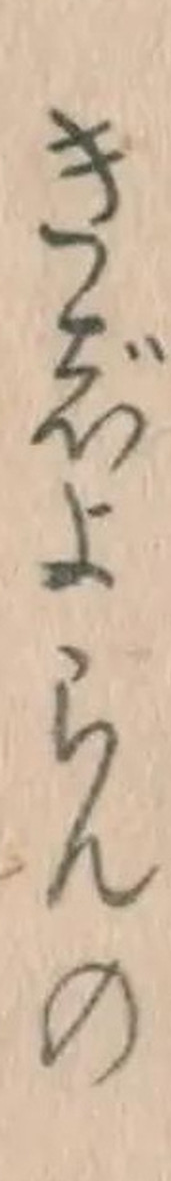きじよらんの
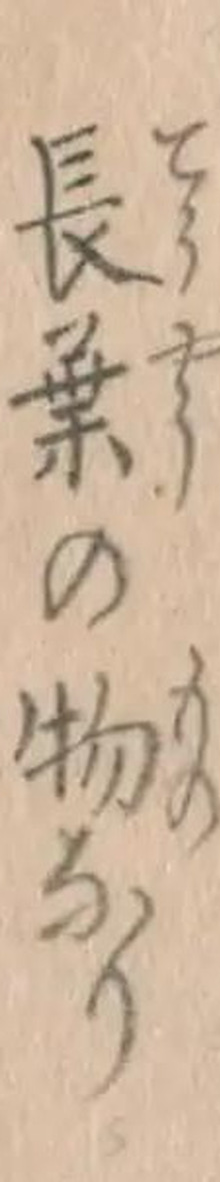長葉の物なり
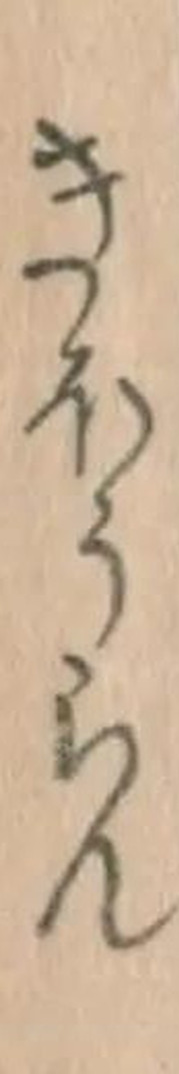きほうらん

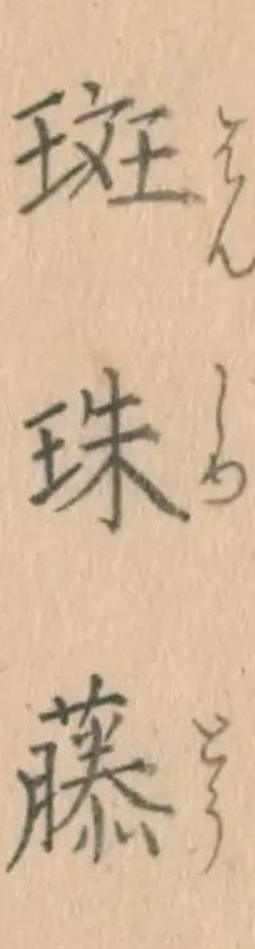斑珠藤
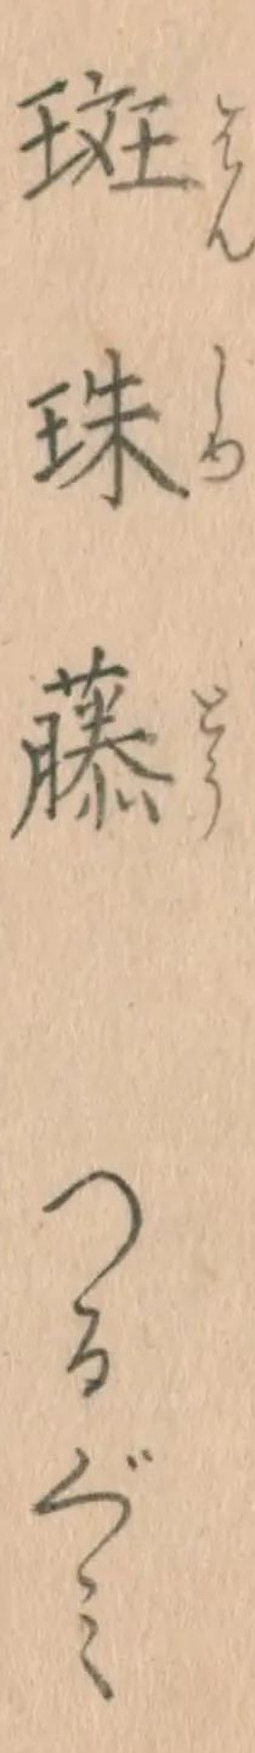斑珠藤つるぐみ
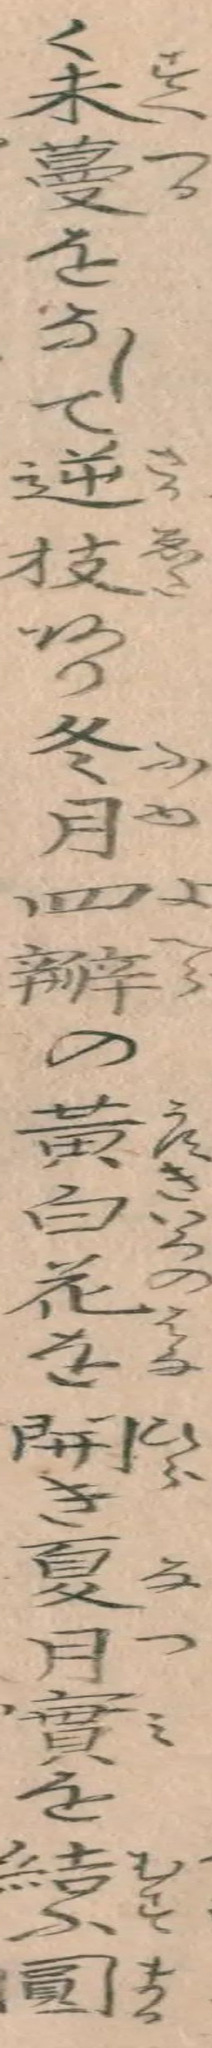く未蔓をなして逆枝あり冬月四弁の黄白花を開き夏月実を結ふ円
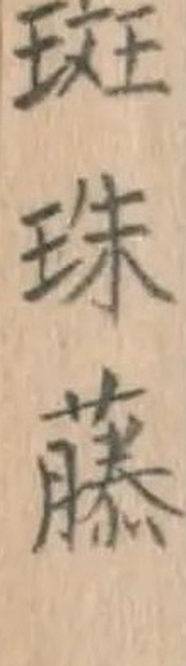斑珠藤

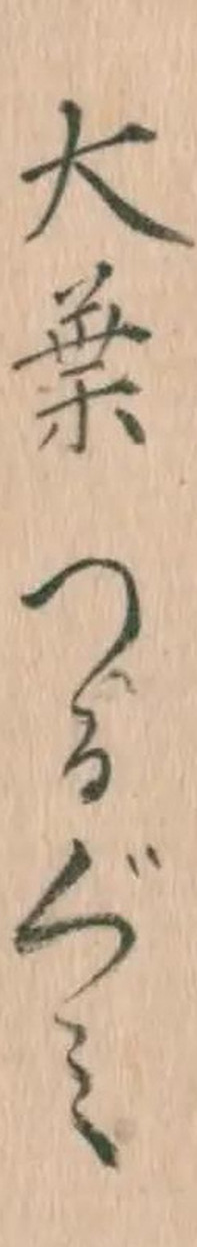大葉つるぐみ

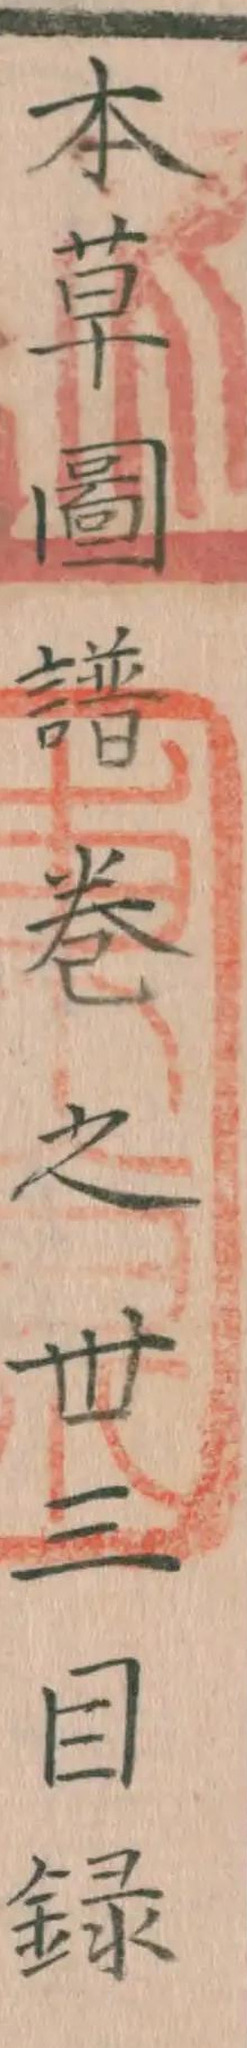本草図譜巻之丗三目録
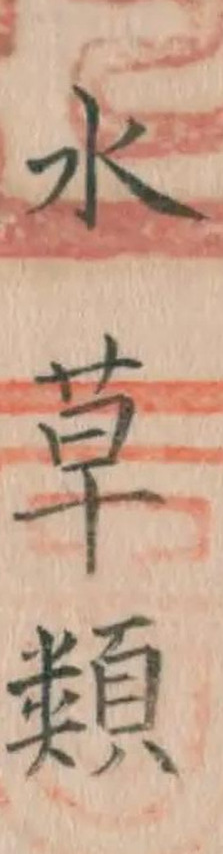水草類

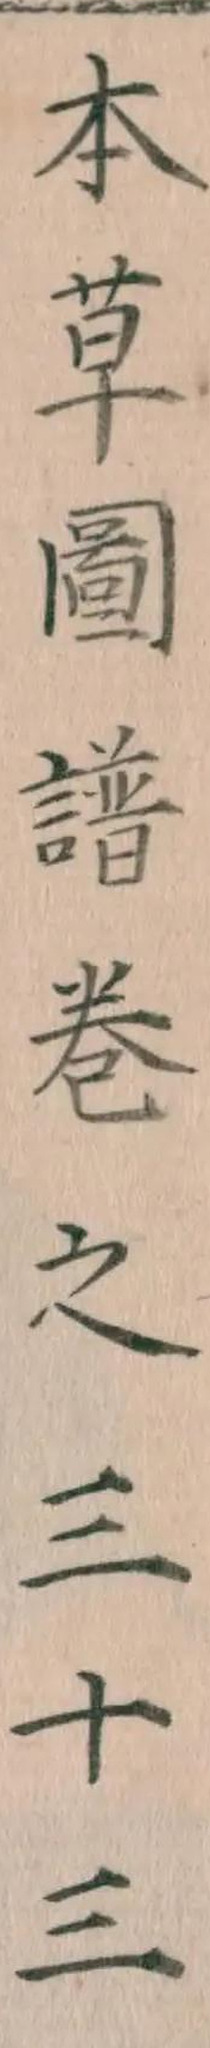本草図譜巻之三十三
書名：本草図譜. 巻31-33
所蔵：国立国会図書館 National Diet Library, JAPAN
